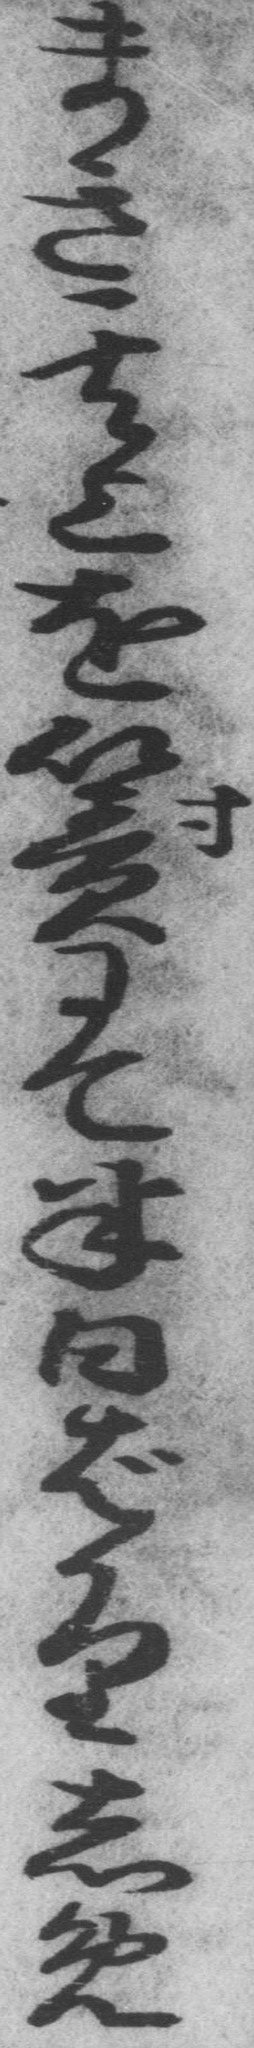まき其上を簀にて半日ばかりしめ
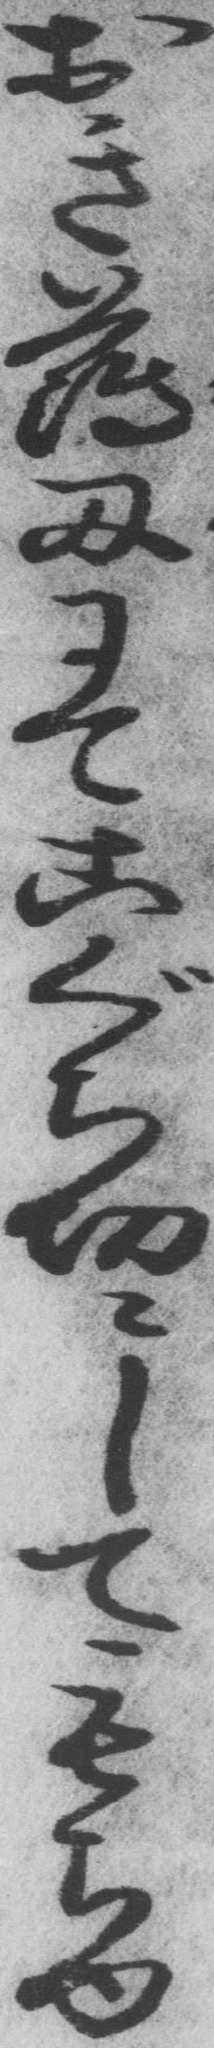おき薄刃にてこぐち切にしてもちゆ
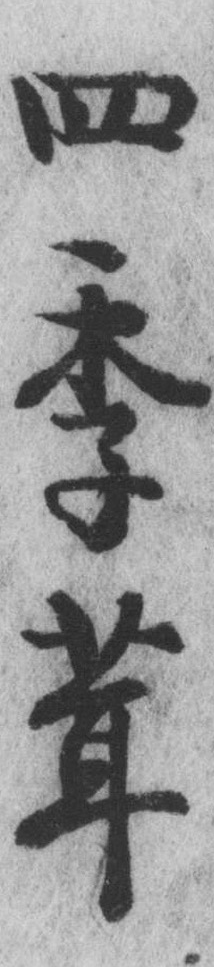四季茸
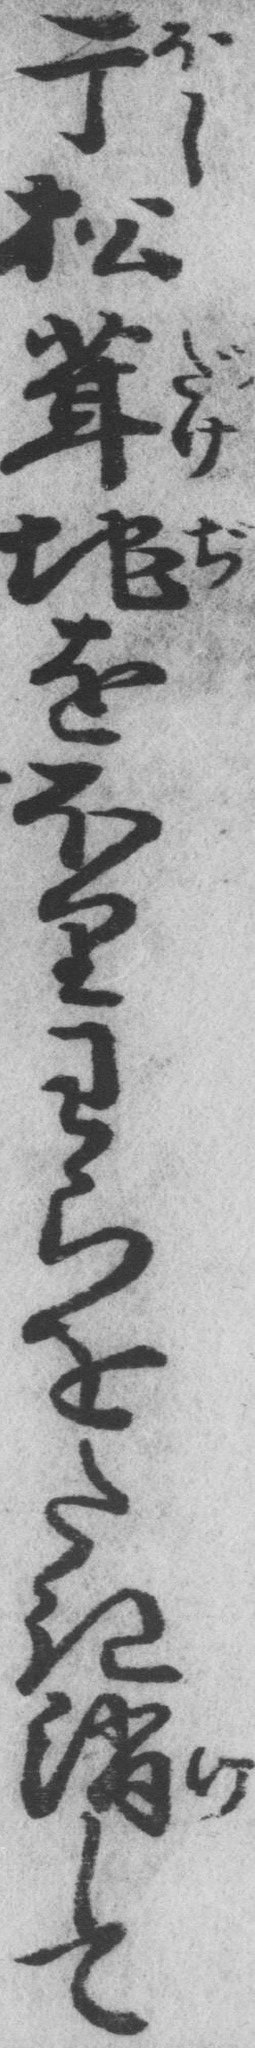干松茸地をほりわらをたき消して
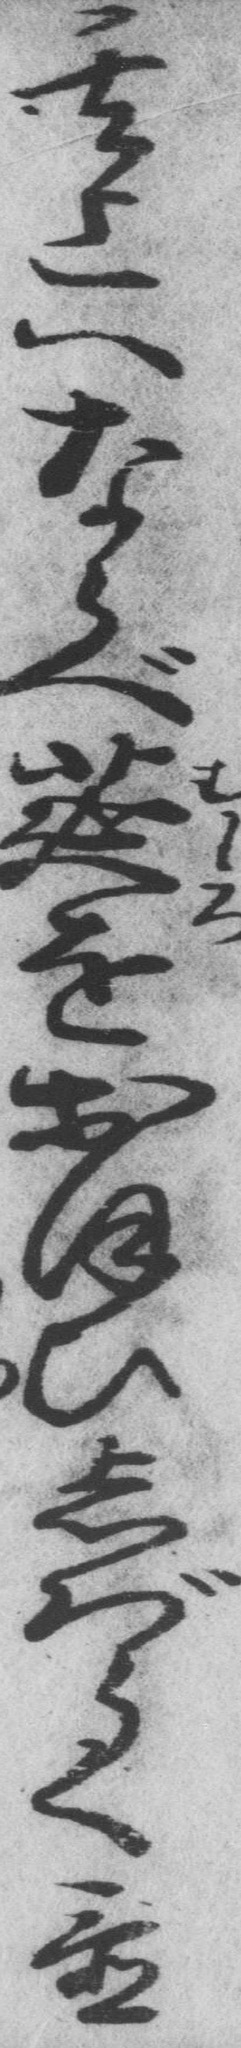其上へならべ筵をおほひしばらく置
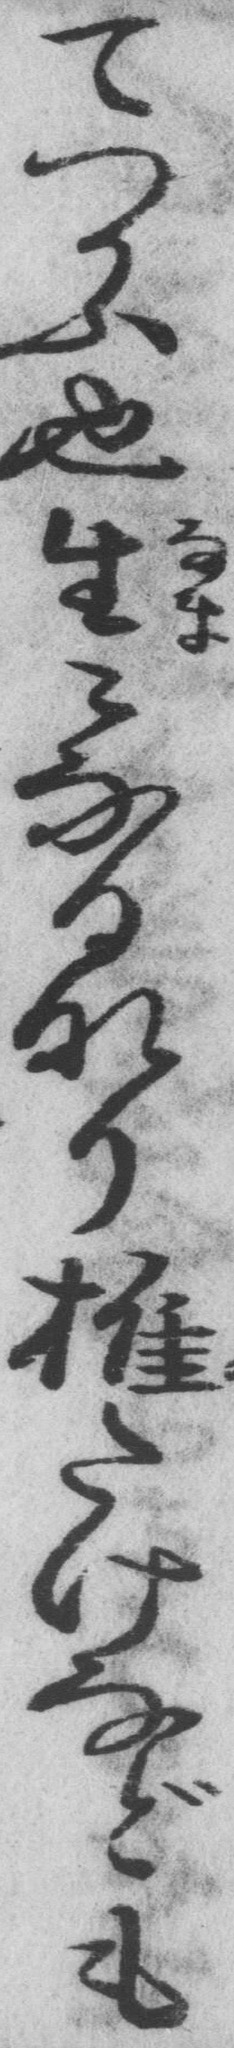てつかふ也生になるなり椎たけなども
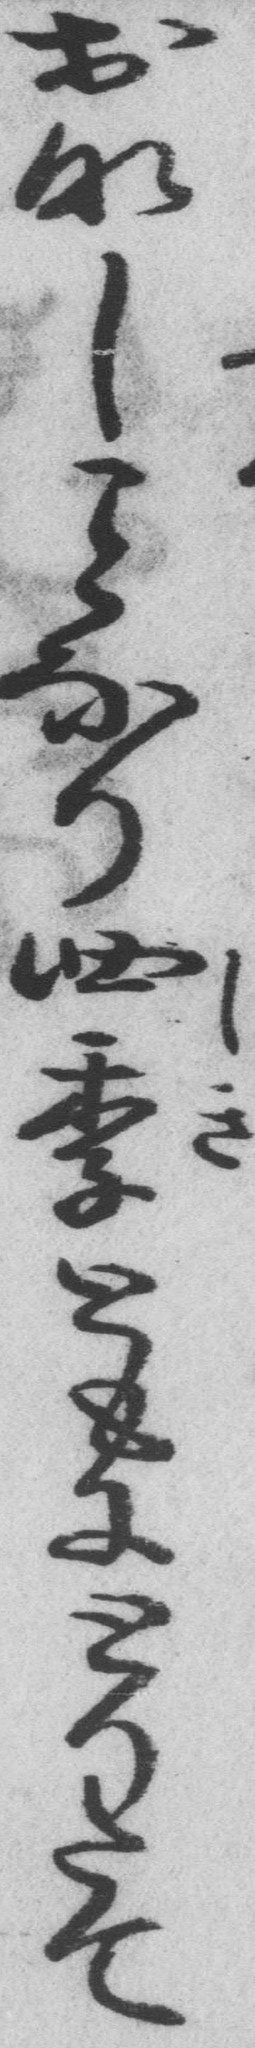おなしことなり四季ともにとりたて
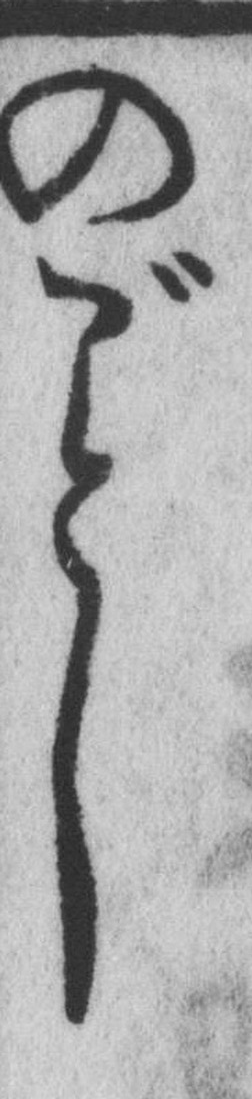のごとし
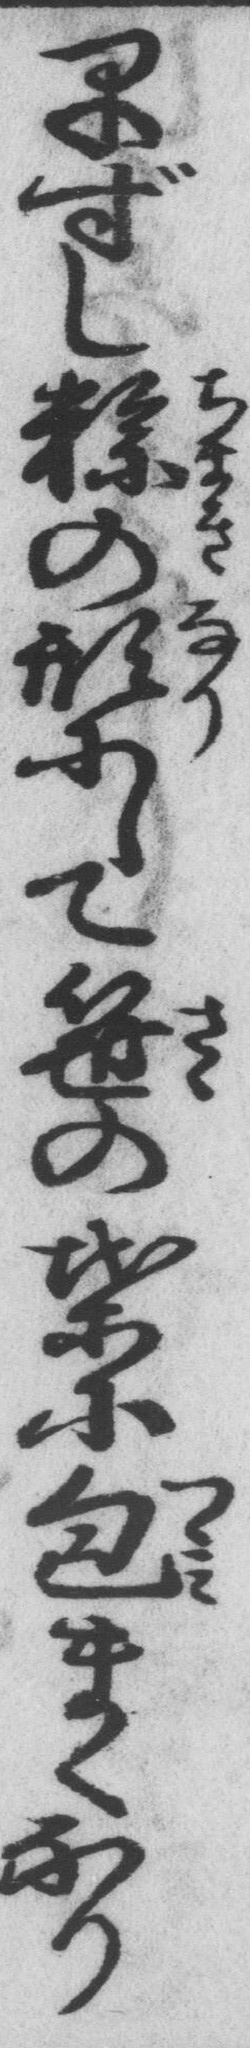早ずし粽の形にして笹の葉に包まくなり
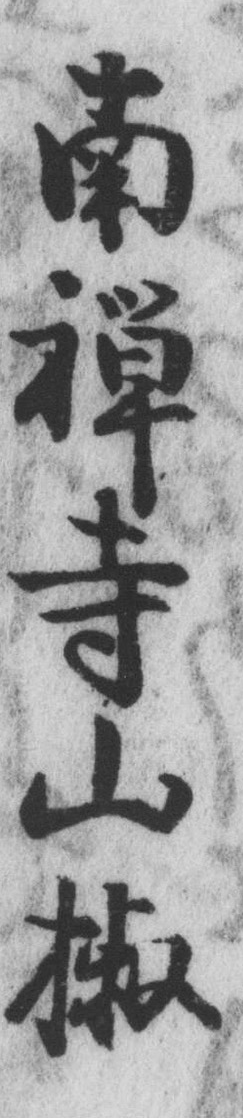南禅寺山椒
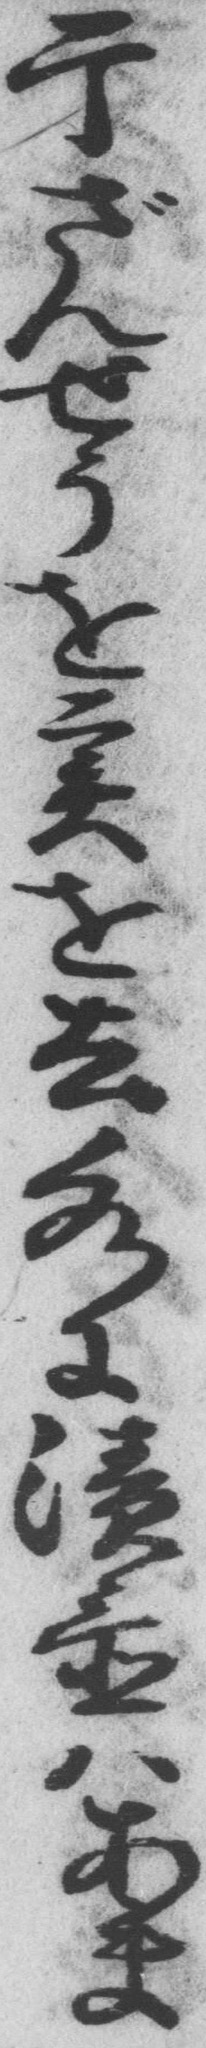干ざんせうを実を去水に漬置はあま
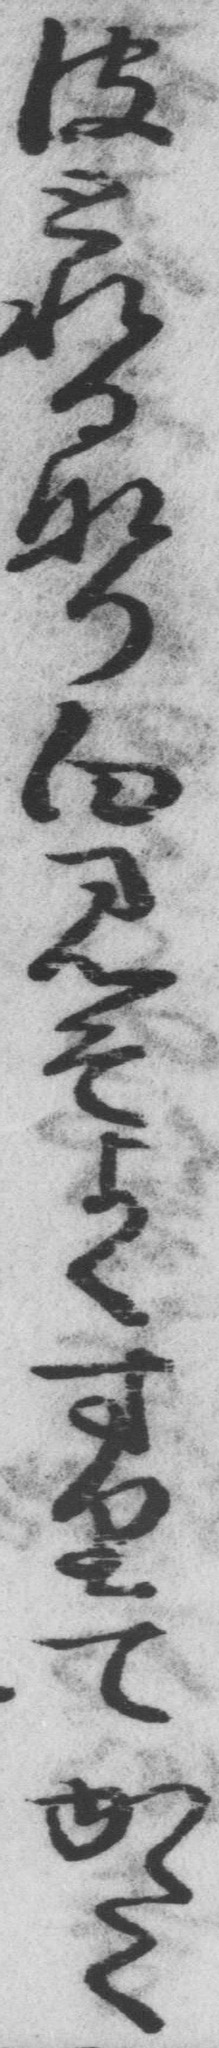皮とれるなり白みそよくすりてかたく
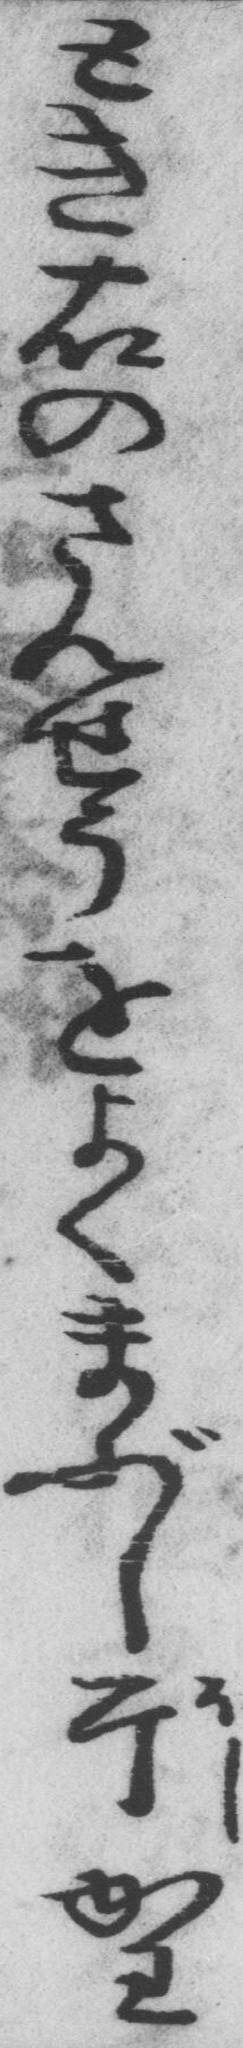とき右のさんせうをよくまぶし干かわ
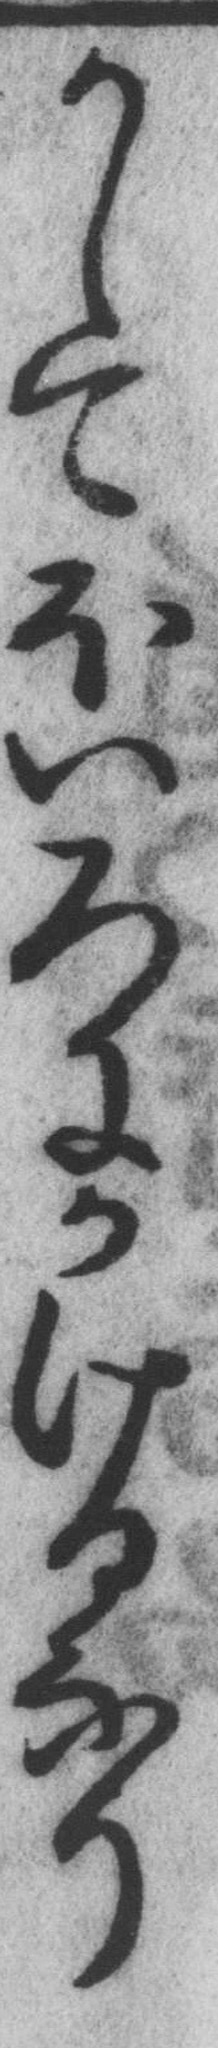かしてほいろにかけるなり

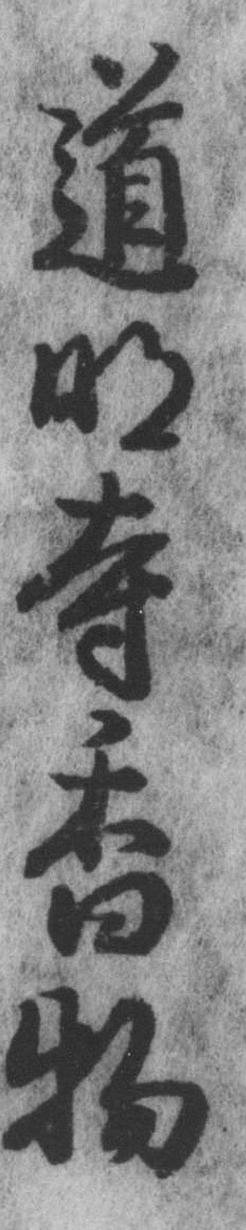道明寺香物
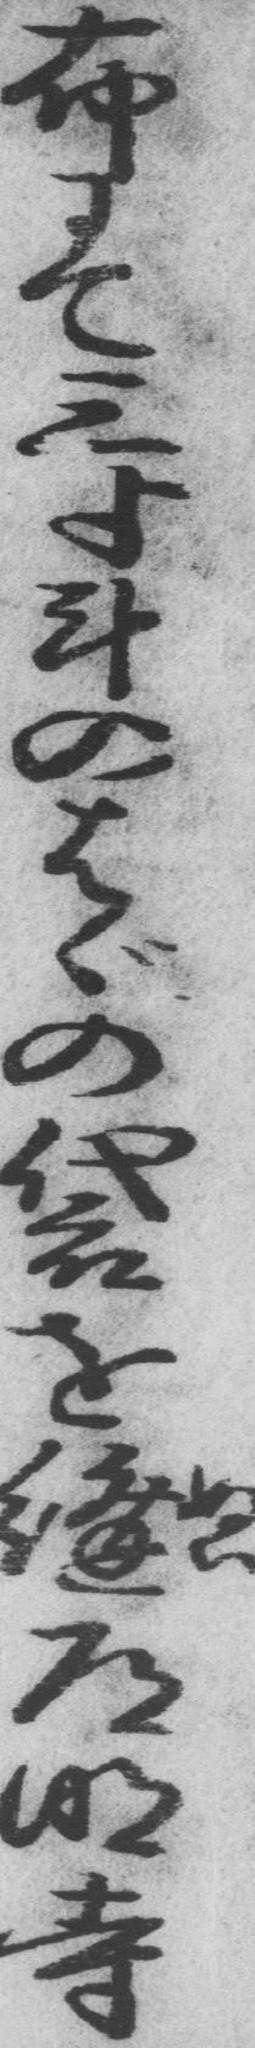布にて三寸斗のはゞの袋を縫道明寺
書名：料理山海郷
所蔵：大阪府立大学学術情報センター 国文学研究資料館
